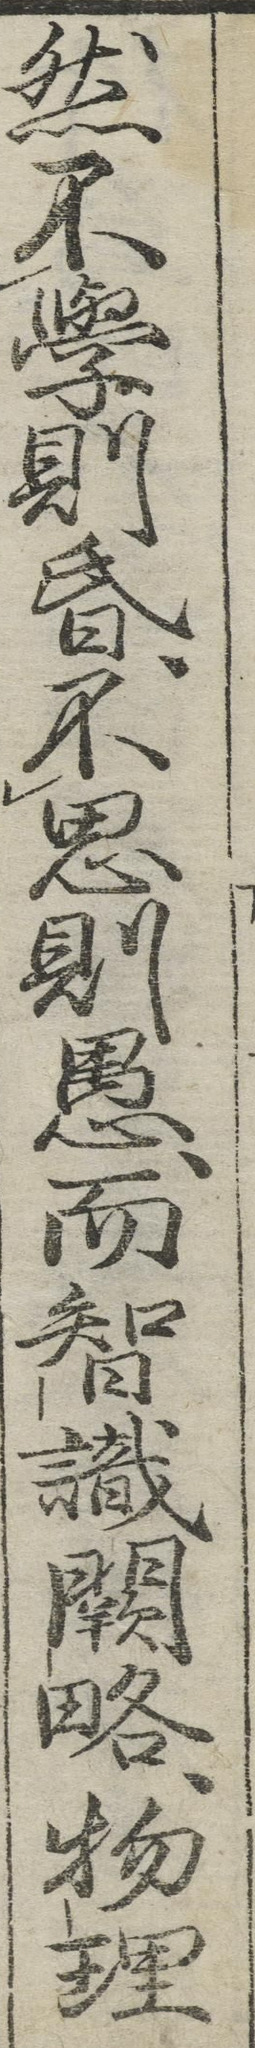然不學則昏、不思則愚而智識闕略、物理
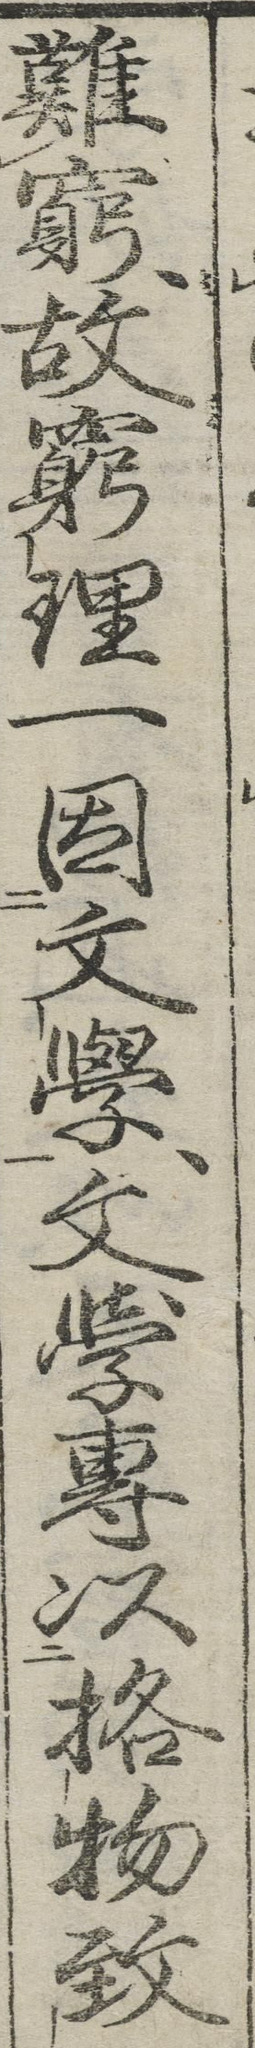難窮、故窮理一因文學、文學專以格物致
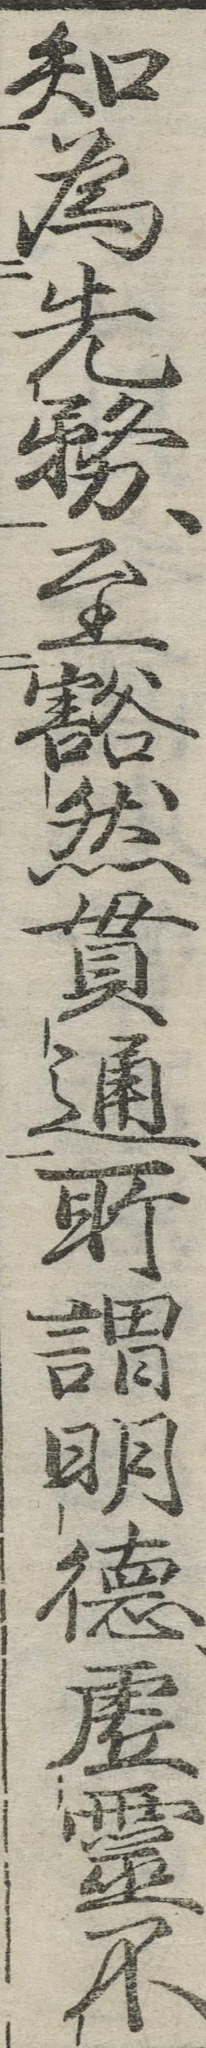知為先務、至豁然貫通、所謂明德、虗靈不
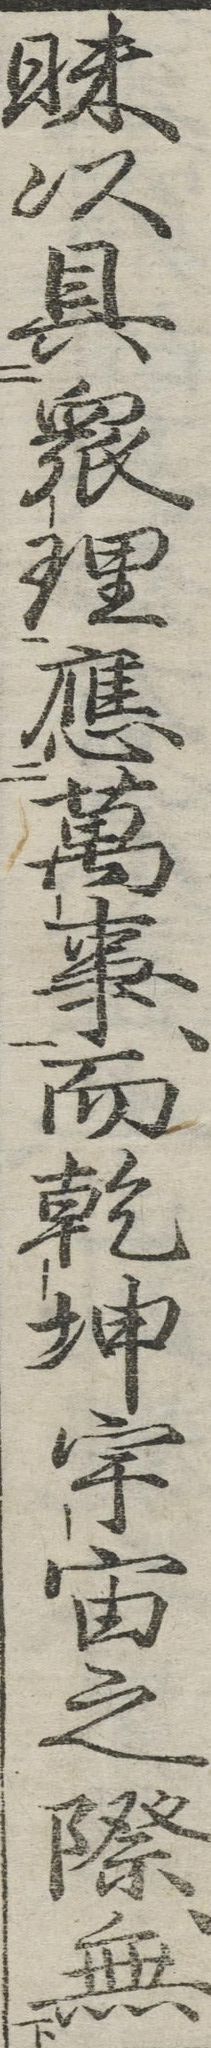昧以具衆理應萬事、而乾坤宇宙之際、無
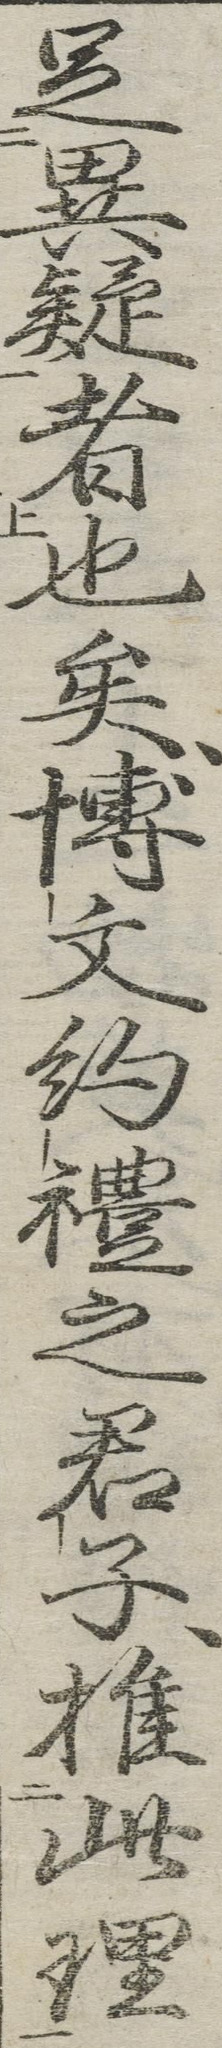足異疑者也矣、博文約禮之君子、推此理
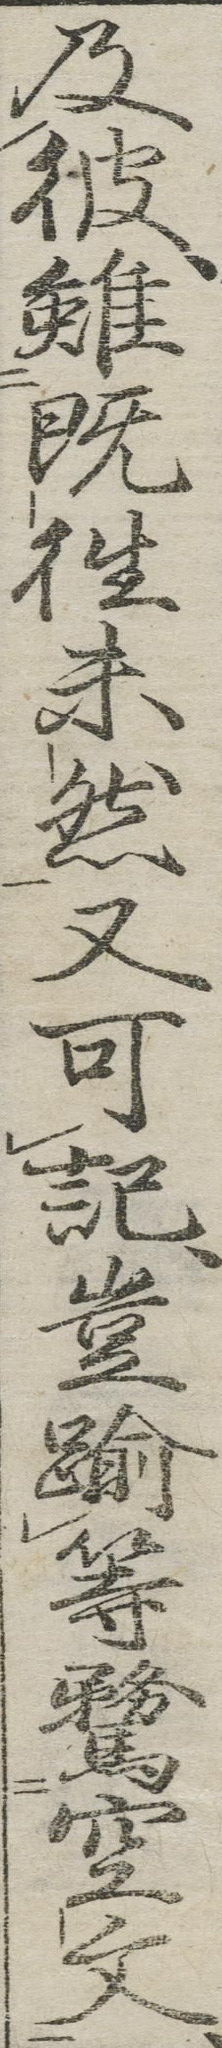及彼、雖既往未然又可記、豈踰等騖空文、
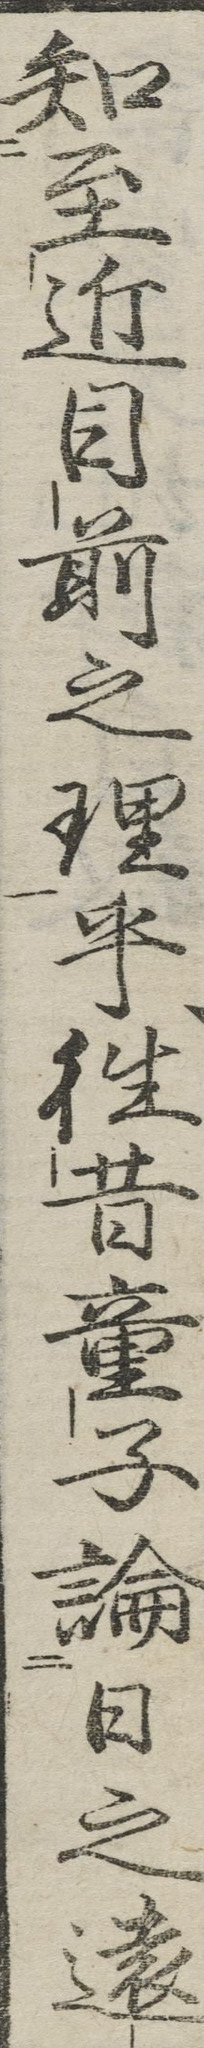知至近目前之理乎、往昔童子論日之遠
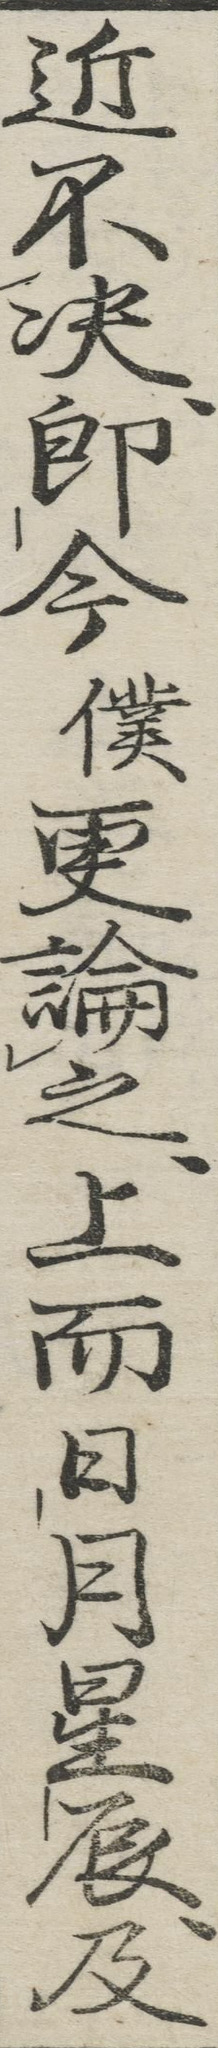近不決、即今僕更論之、上而日月星辰、及
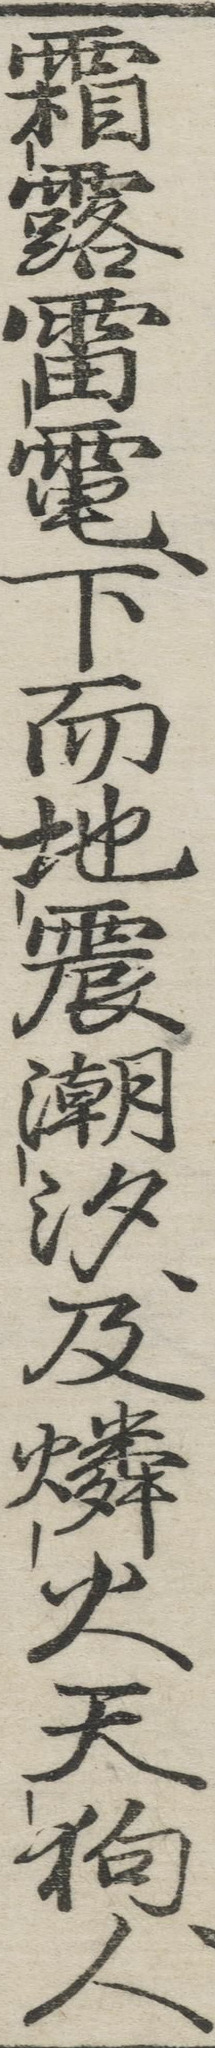霜露雷電、下而地震潮汐、及燐火天狗、人
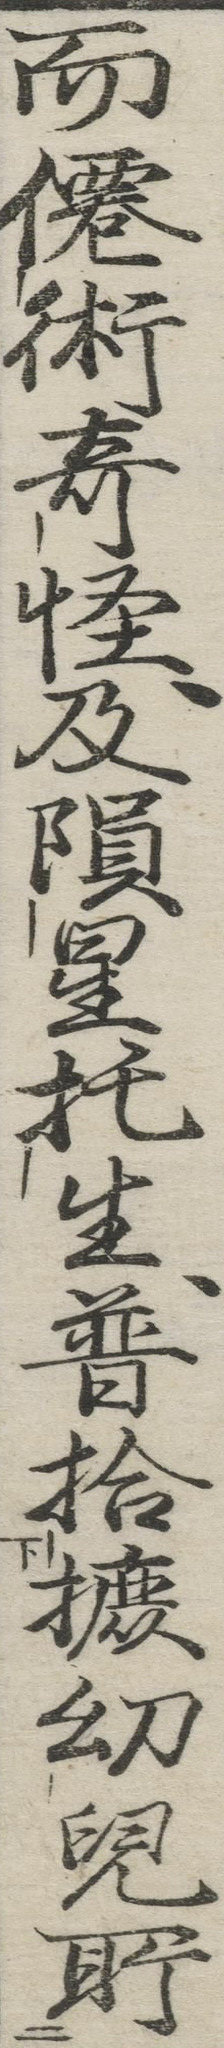而僊術奇怪、及隕星托生、普拾摭幼兒所
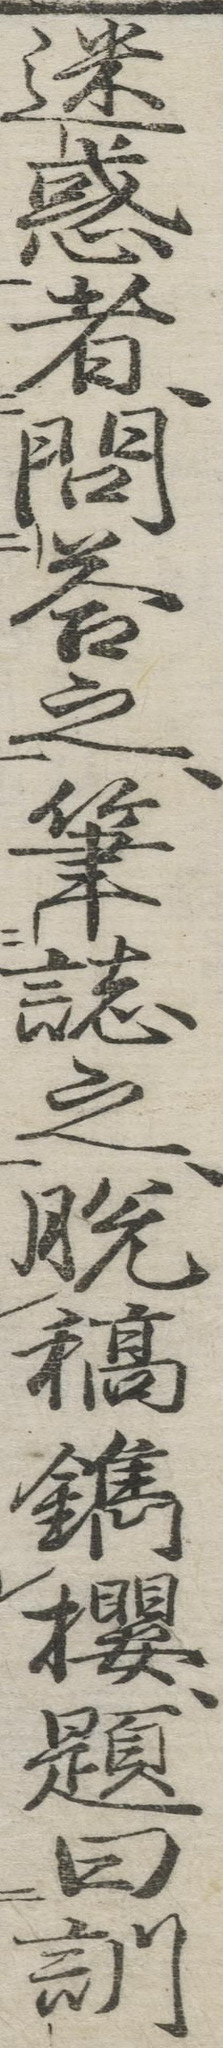迷惑者、問答之、筆誌之、脱稿鐫櫻、題曰訓
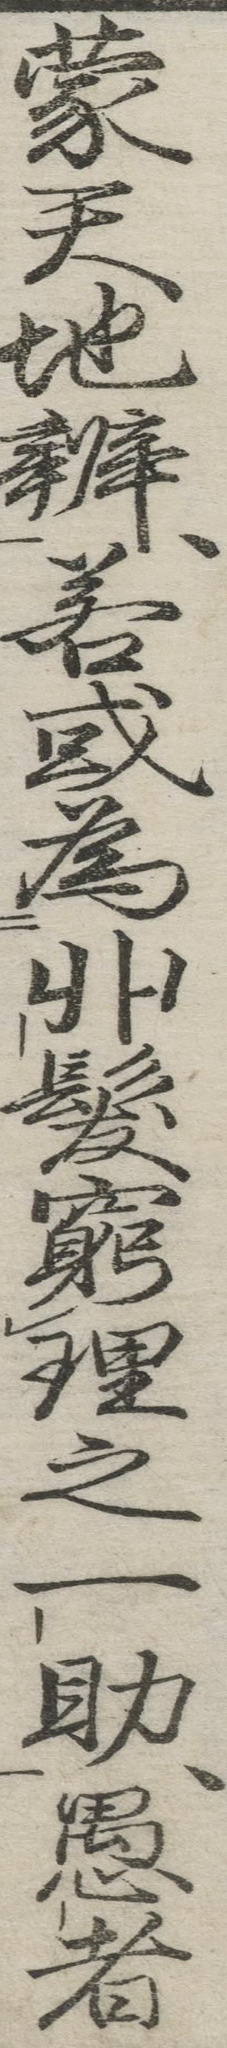蒙天地辨、若或為丱髮窮理之一助、愚者
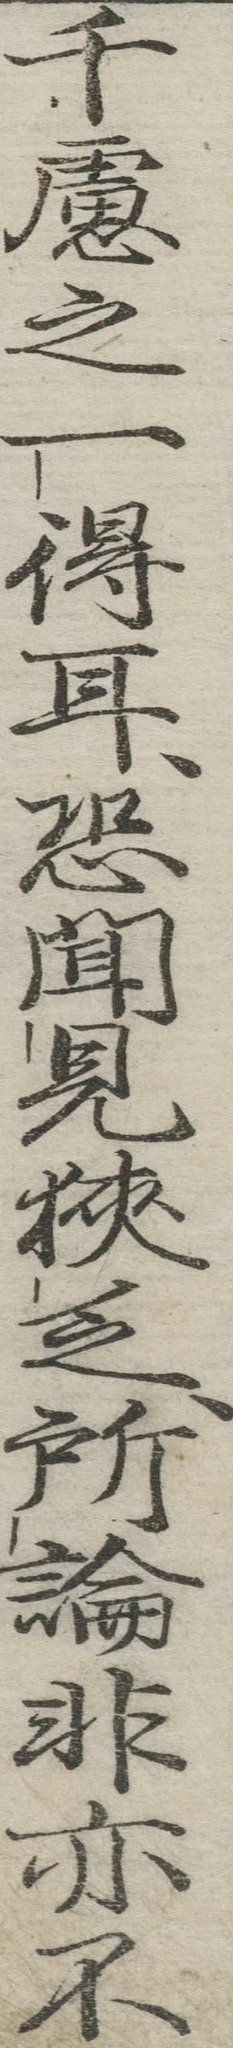千慮之一得耳、恐聞見狹乏、所論非亦不
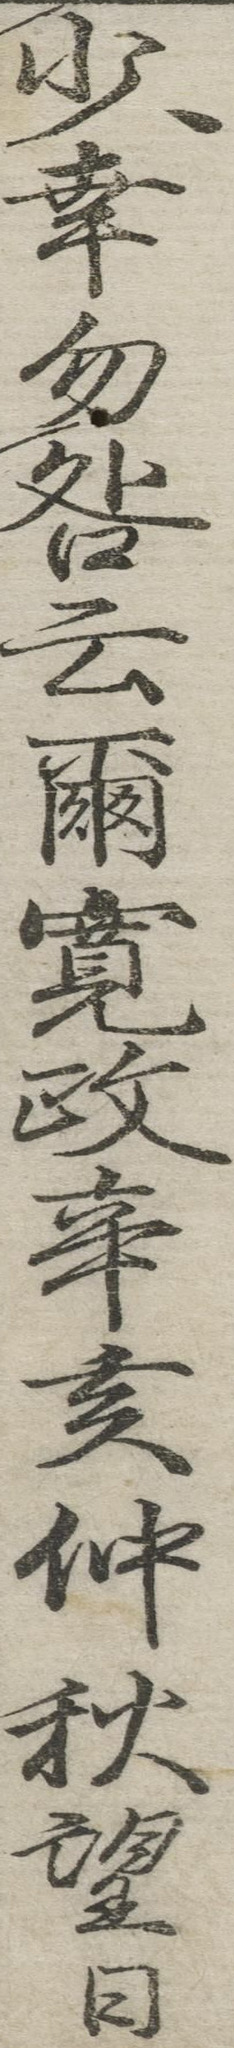少、幸勿咎云爾寬政辛亥仲秋望日

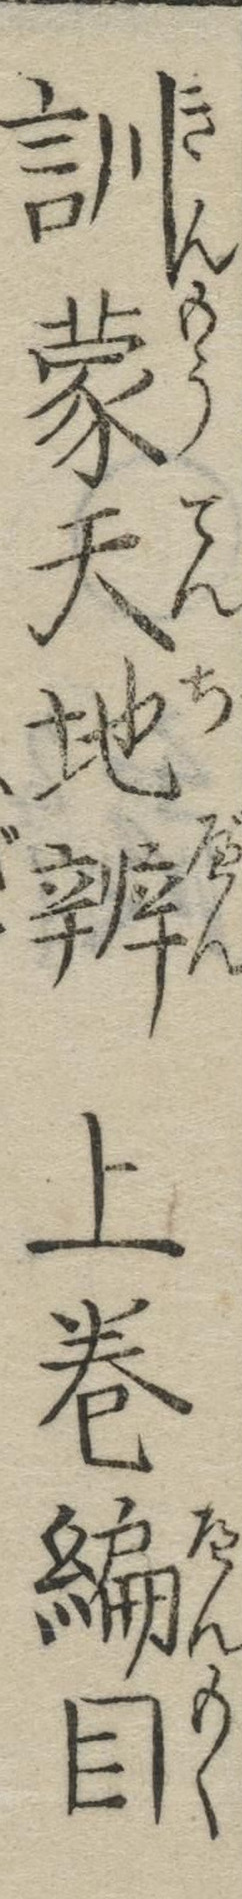訓蒙天地辨上巻編目

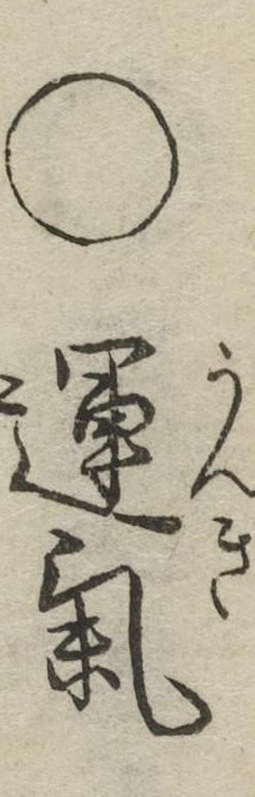○運気
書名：訓蒙天地辨　天
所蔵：東京大学地震研究所図書室 Earthquake Research Institute Library, The University of Tokyo, JAPAN
